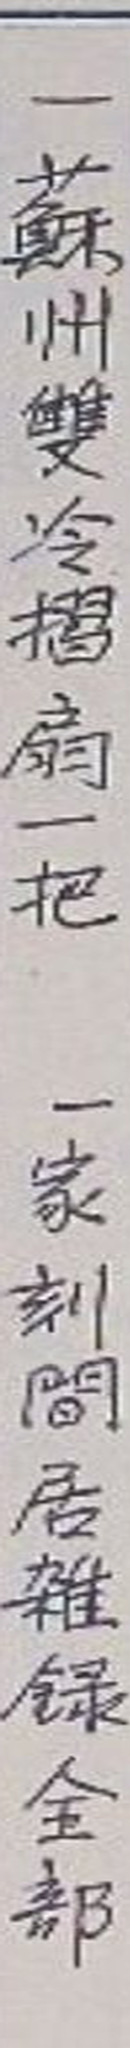一蘇州雙冷摺扇一把一家刻間居雑録全部
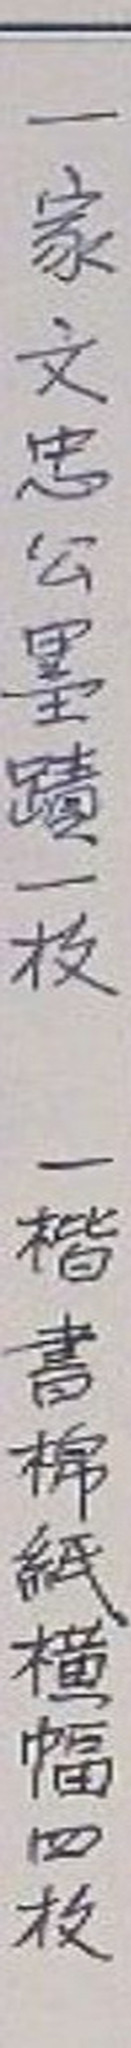一文家忠公墨蹟一枚一楷書棉紙横幅四枚
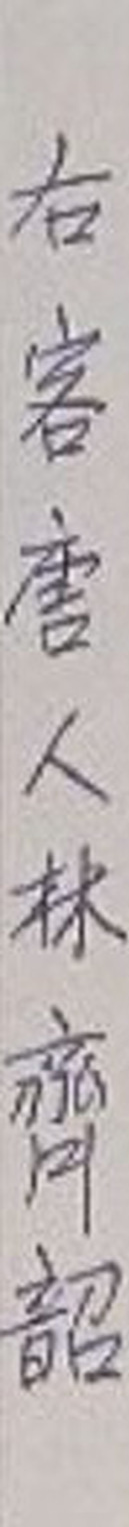右客唐人林齊韶

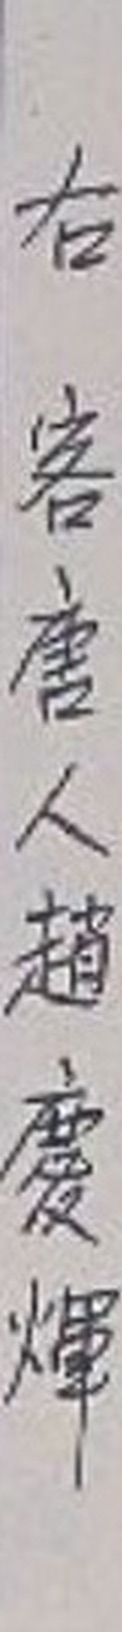右客唐人趙慶煇
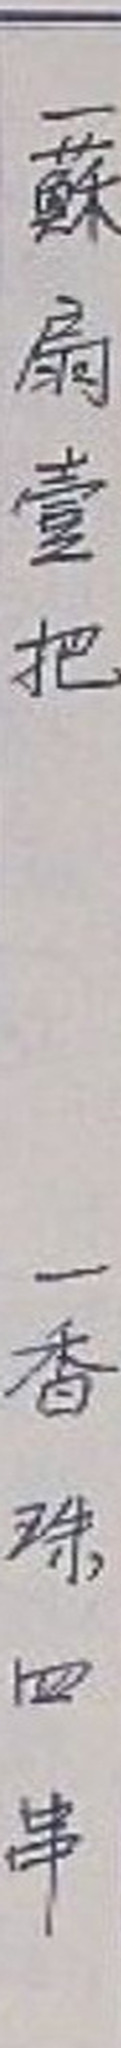一蘇扇壱把一香珠四串
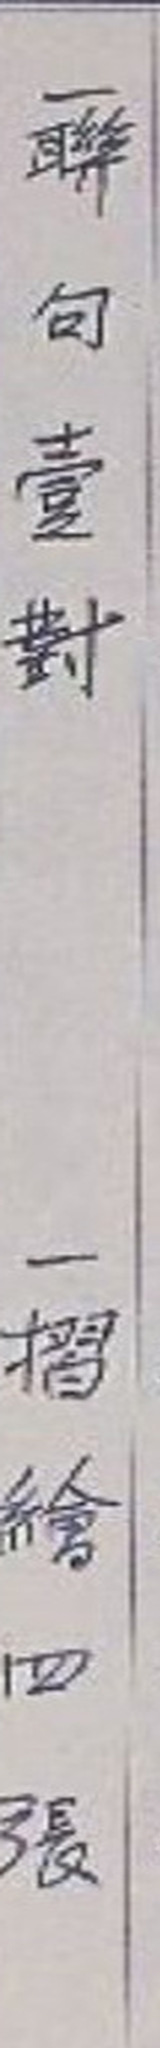一聯句壱対一摺絵四張
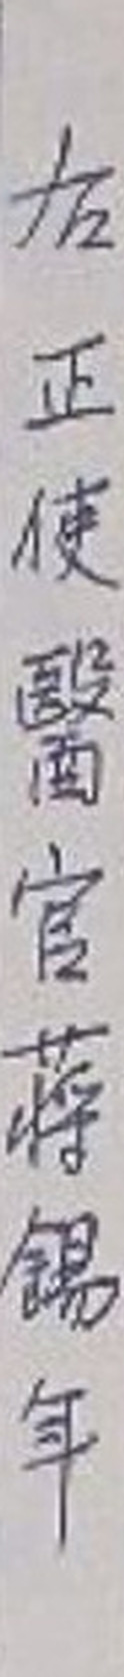右正使医官䉃錫年
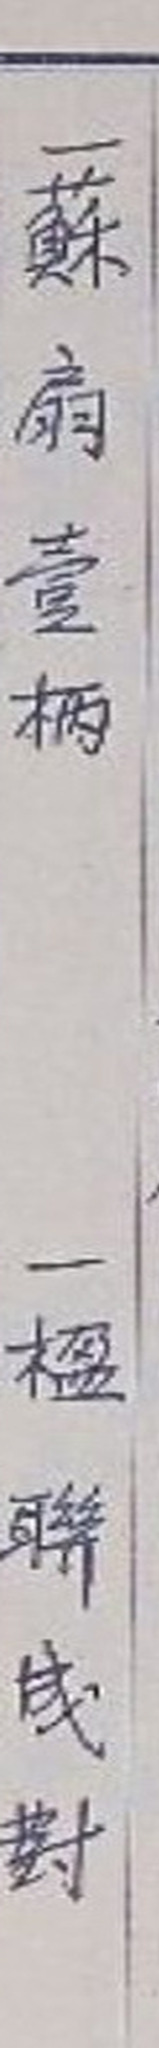一蘇扇壱柄一楹聯成対
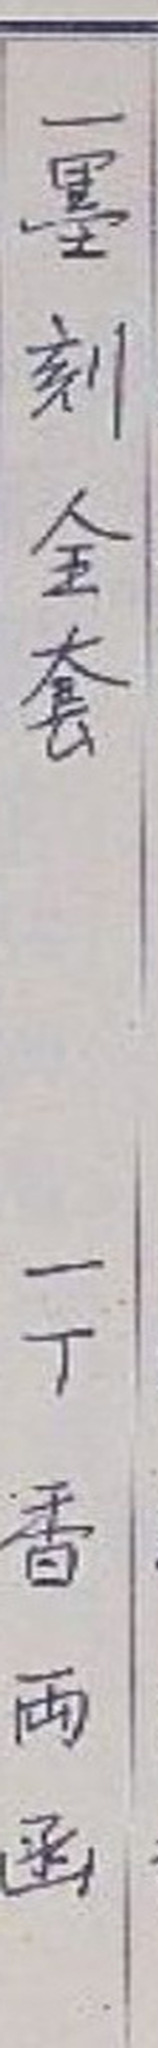一墨刻全套一丁香両函
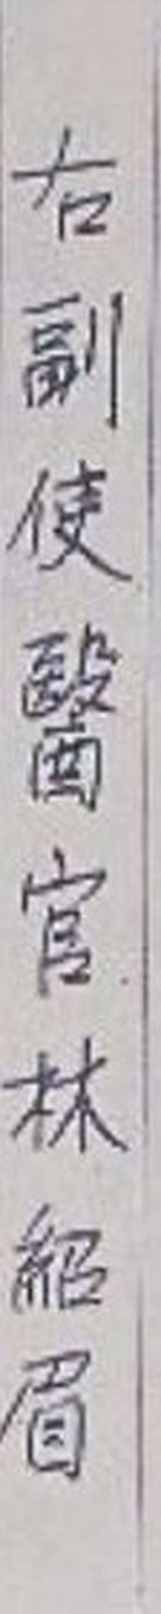右副使医官林紹眉
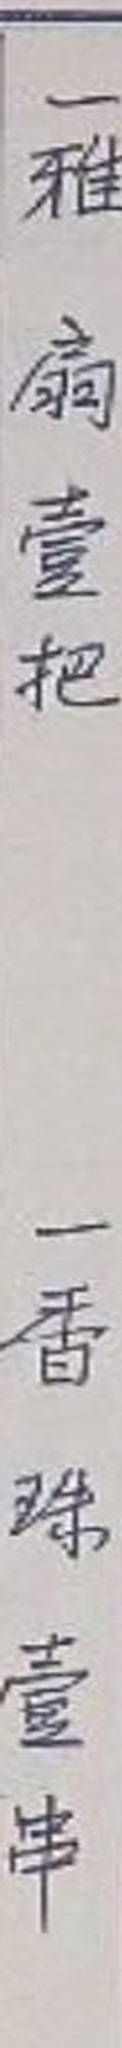一雅扇壱把一香珠壱串
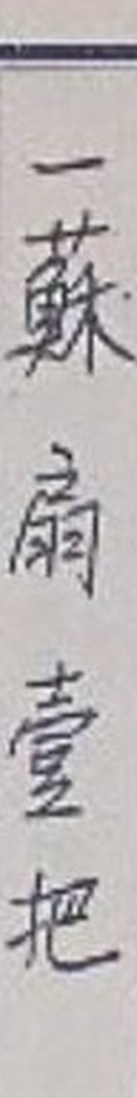一蘇扇壱把一聯句壱対
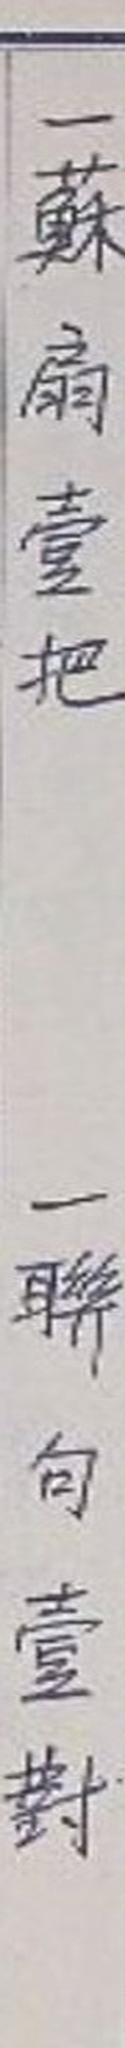一蘇扇壱把一聯句壱対
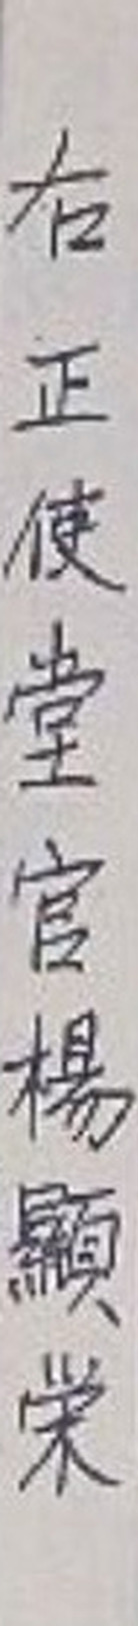右正使堂官楊顕栄
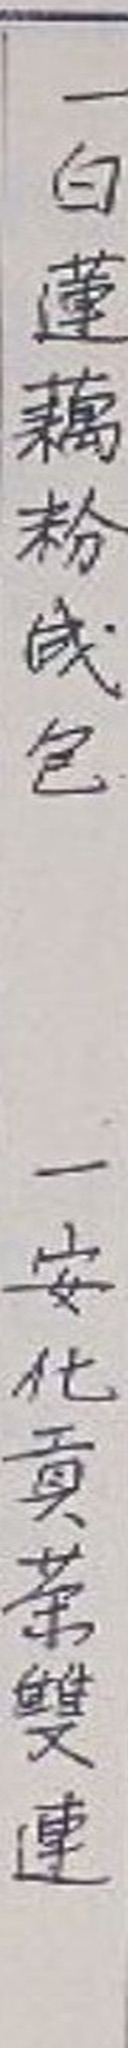一白蓮藕粉成包一安化貢茶雙連
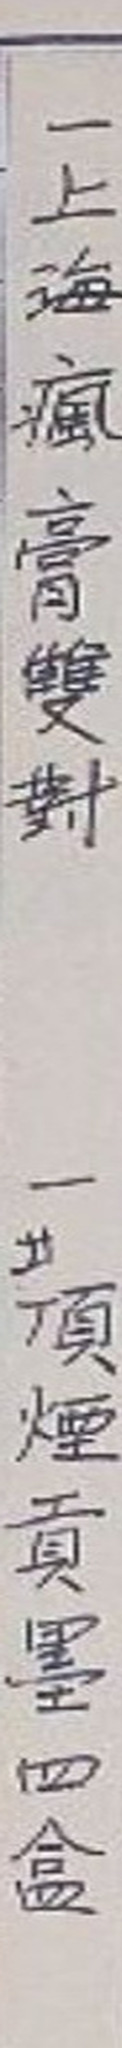一上海瘋膏雙対一頂煙貢墨四盒
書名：支那冊封使来琉諸記 下巻
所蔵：University of the Ryukyus Library
